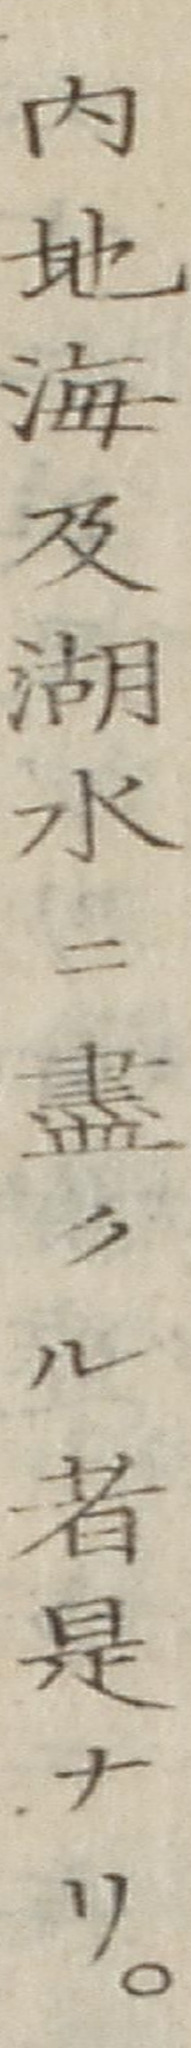内地海及湖水ニ尽クル者是ナリ。
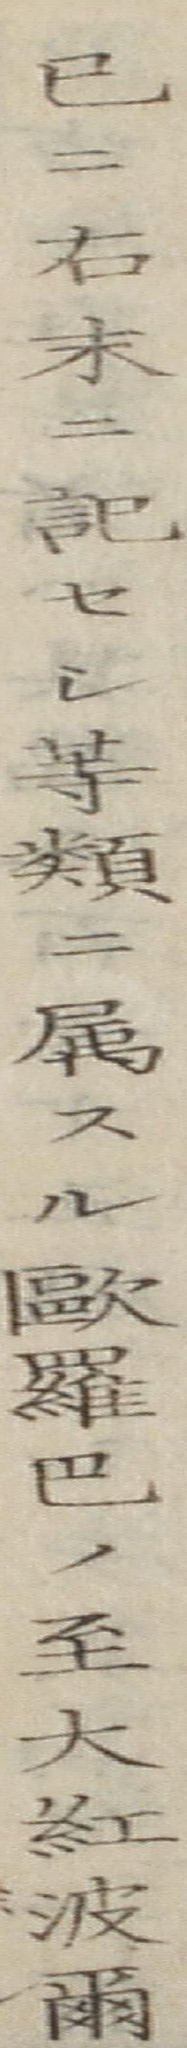已ニ右末ニ記セシ等類ニ属スル欧羅巴ノ至大紅波爾
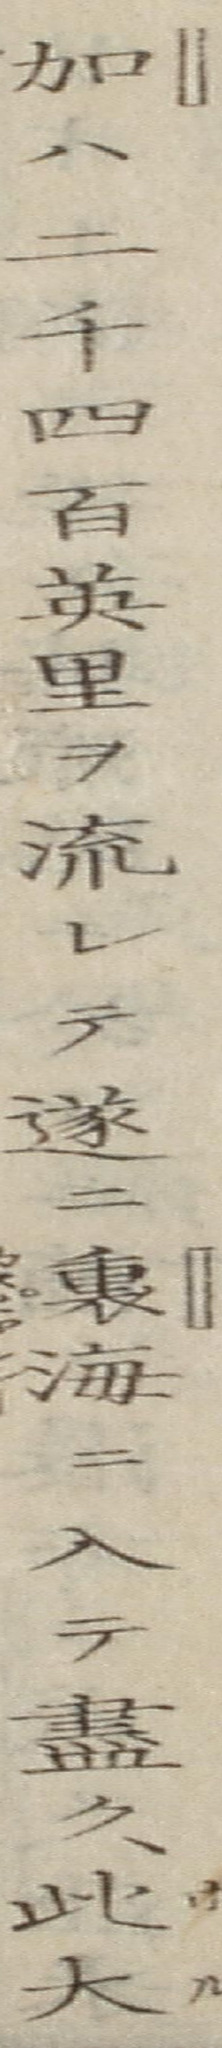加ハ二千四百英里ヲ流レテ遂ニ裏海ニ入テ尽ク、此大
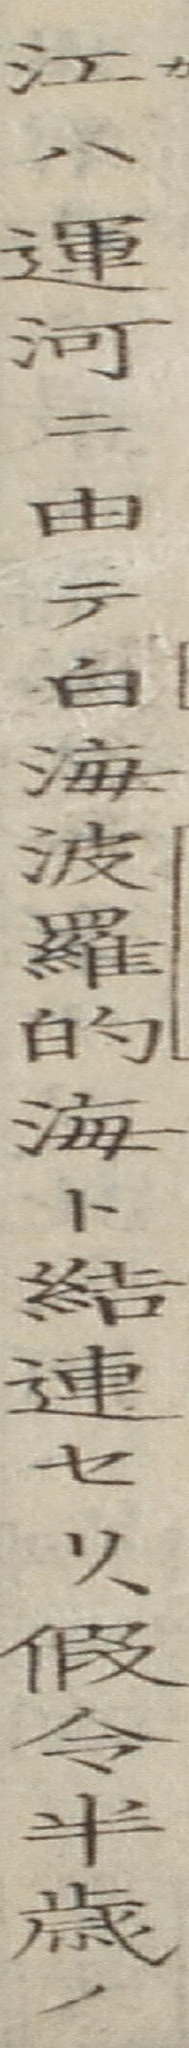江ハ運河ニ由テ白海波羅的海ト結連セリ、仮令半歳ノ
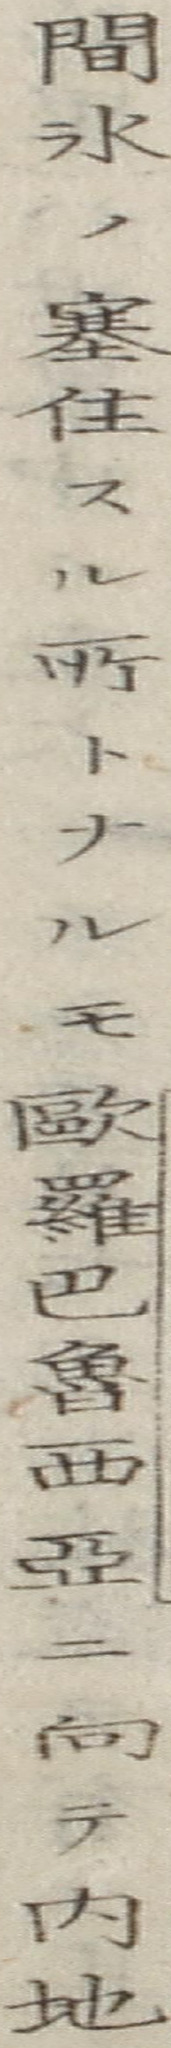間氷ノ塞住スル所トナルモ欧羅巴魯西亜ニ向テ内地
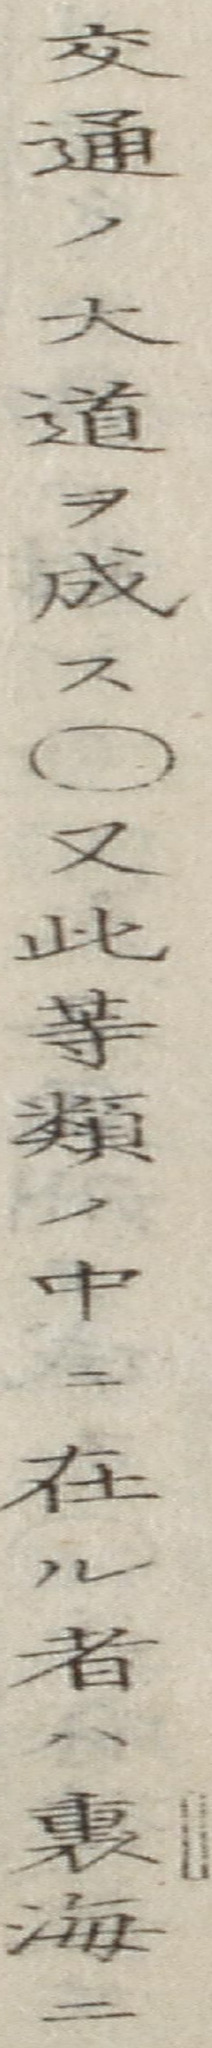交通ノ大道ヲ成ス〇又此等類ノ中ニ在ル者ハ裏海ニ
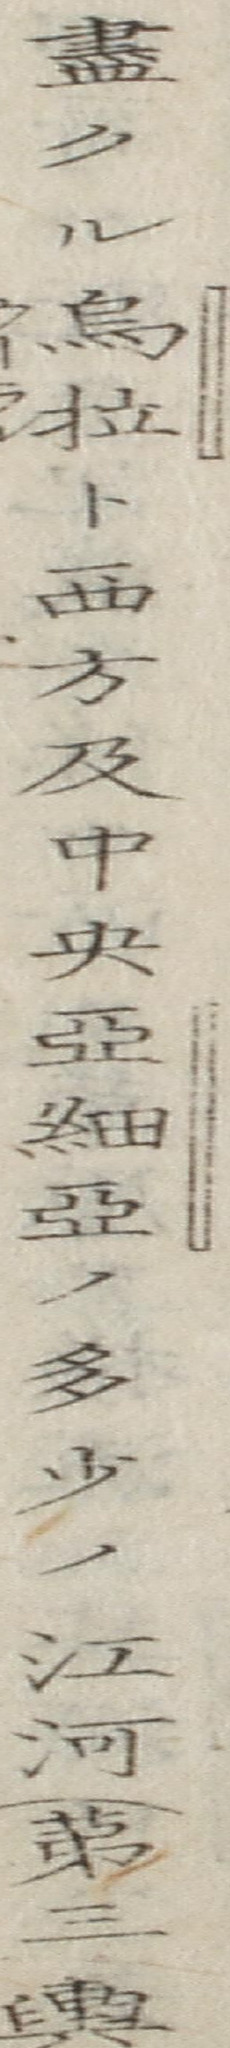尽クル島拉ト西方及中央亜細亜ノ多少ノ江河（第三輿
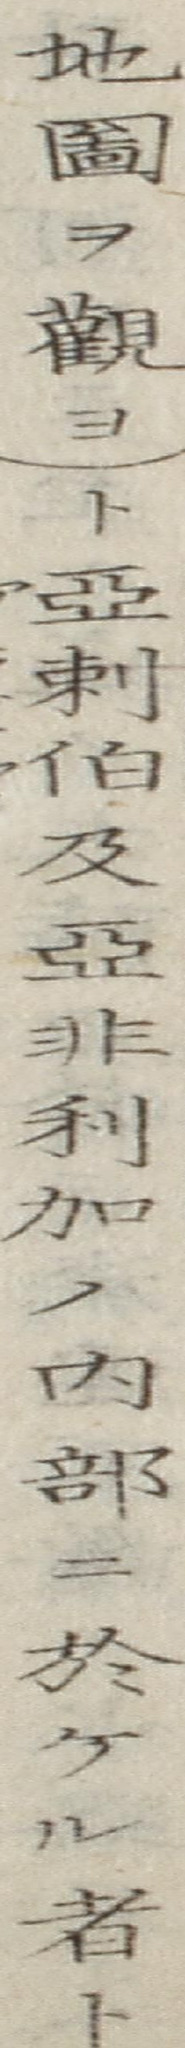地図ヲ観ヨ）ト亜刺伯及亜非利加ノ内部ニ於ケル者ト
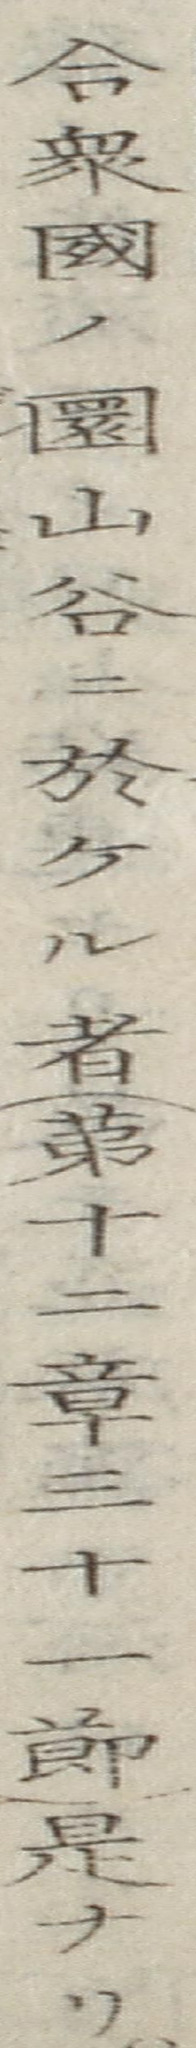合衆国ノ圜山谷ニ於ケル者是ナリ。
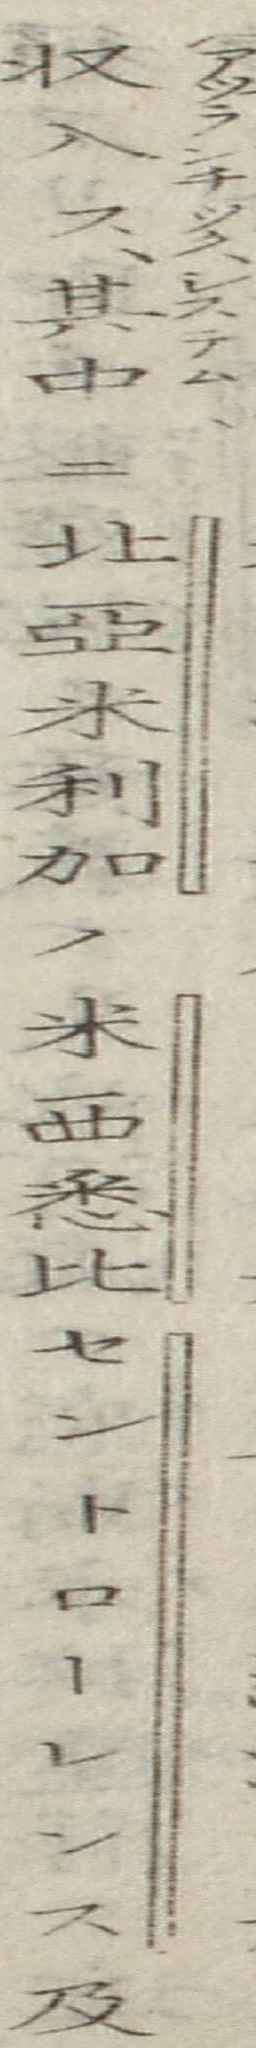収入ス、其中ニ北亜米利加ノ米西悉比セントローレンス及
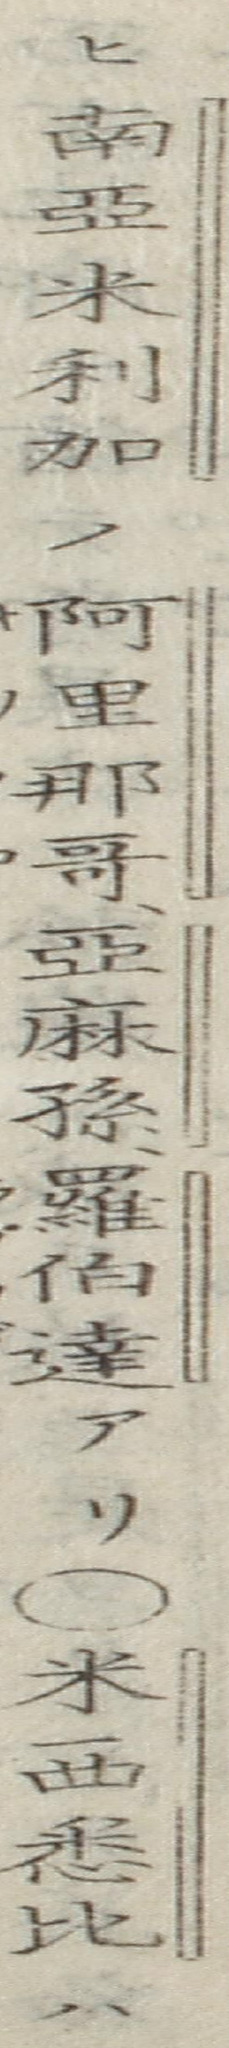ヒ南亜米利加ノ阿里那哥、亜麻孫、羅伯達アリ〇米西悉比ハ
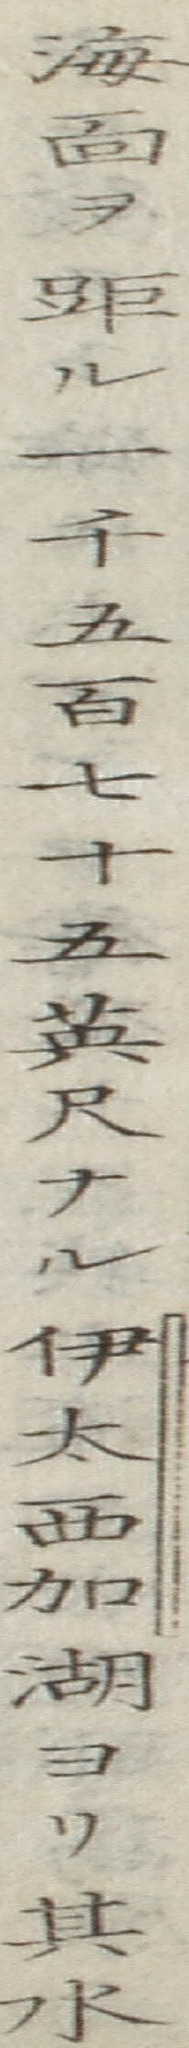海面ヲ距ル一千五百七十五英尺ナル伊太西加湖ヨリ其水
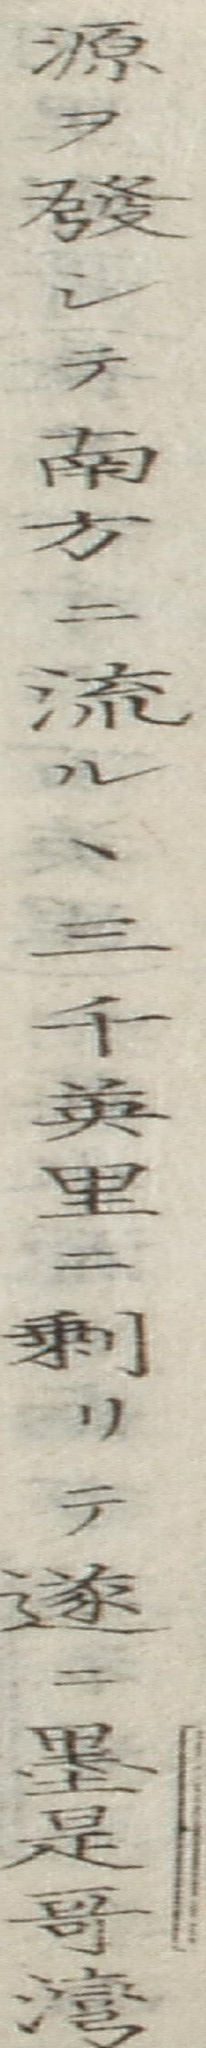源ヲ発シテ南方ニ流ルヽ三千英里ニ剰リテ遂ニ墨是哥湾
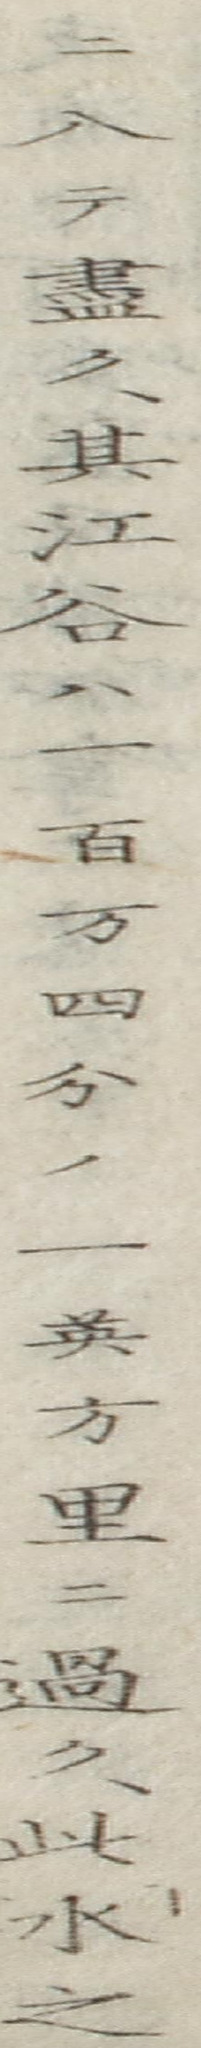ニ入テ尽ク、其江谷ハ一百万四分ノ一英方里ニ過ク、此水之
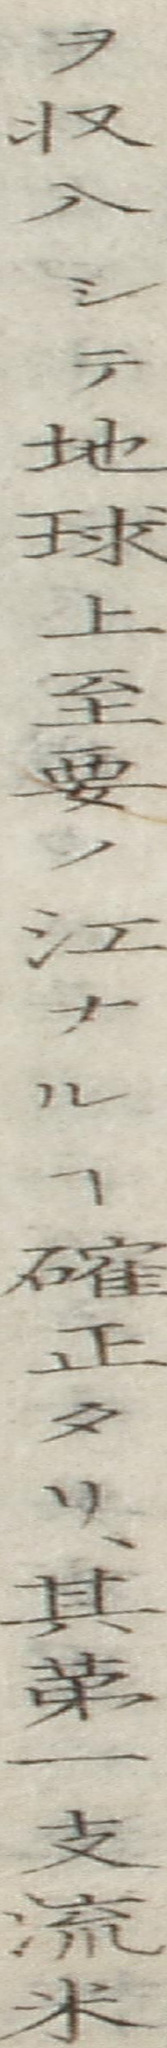ヲ収入シテ地球上至要ノ江ナルヿ確正タリ、其第一支流米
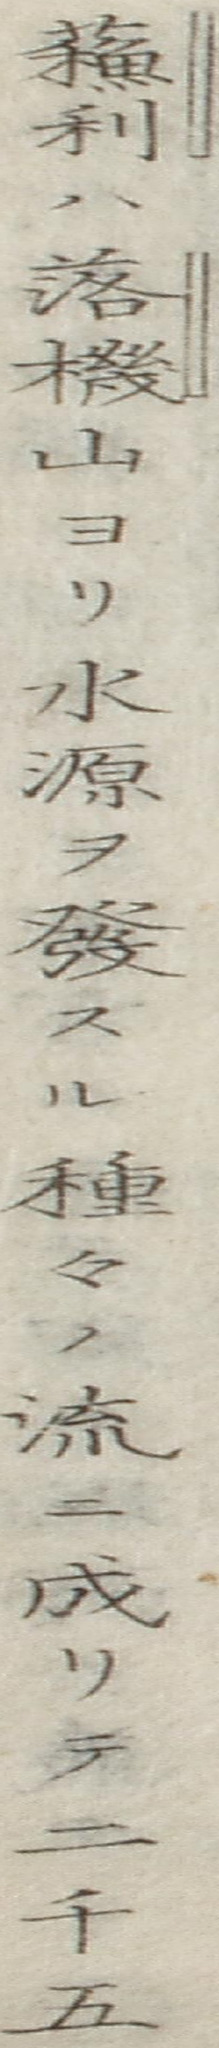蘇利ハ落機山ヨリ水源ヲ発スル種々ノ流ニ成リテ二千五
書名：地形論　巻二
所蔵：東京大学地震研究所図書室 Earthquake Research Institute Library, The University of Tokyo, JAPAN
